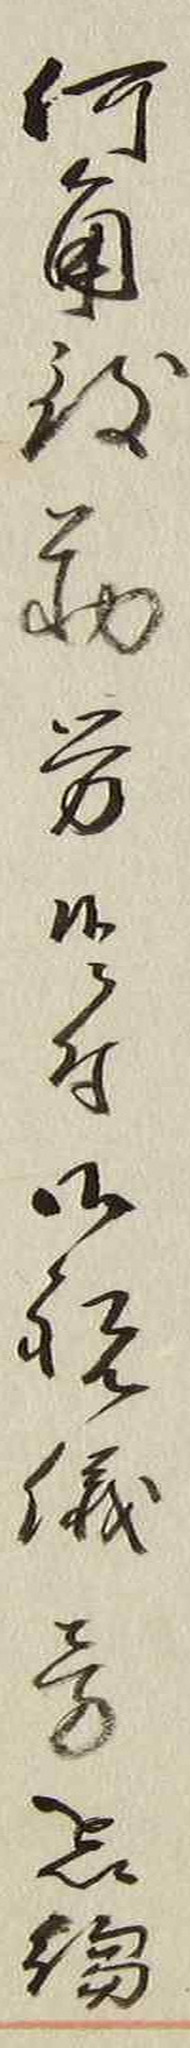何角致勤労候に付御祝儀旁を以趨
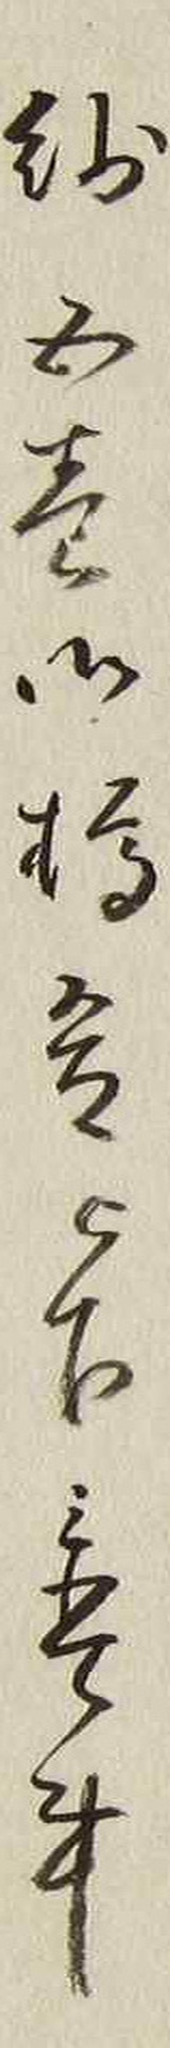紗五巻御樽壱被下置候事
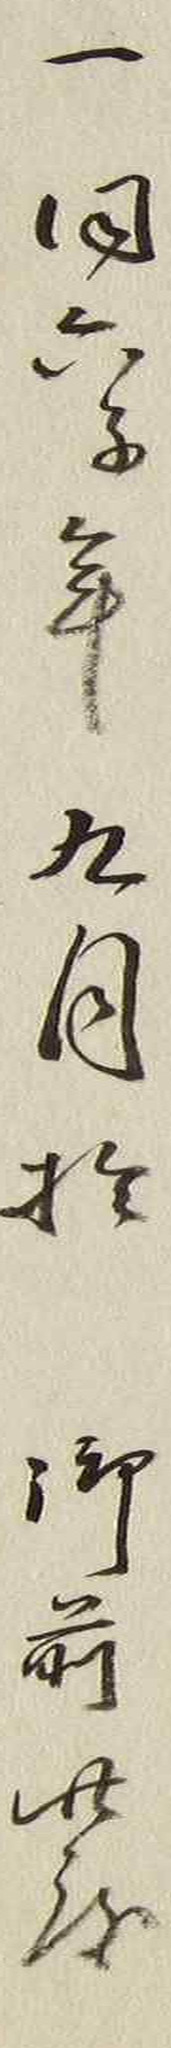一同六子年九月於御前此度
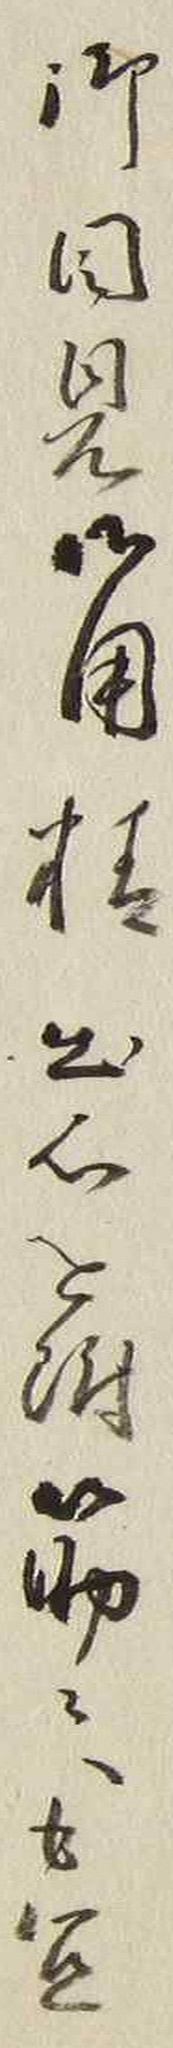御目見御用精出心を附筋々へも宜
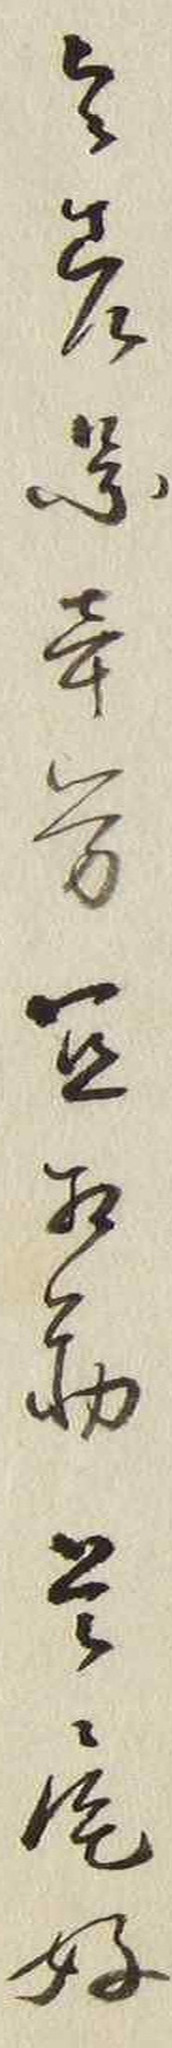く差図辛労宜相勤首尾好

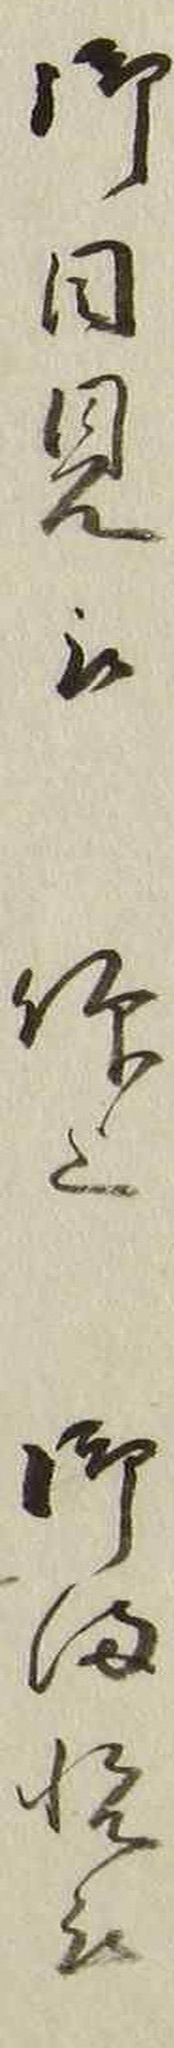御目見被仰上御満悦被
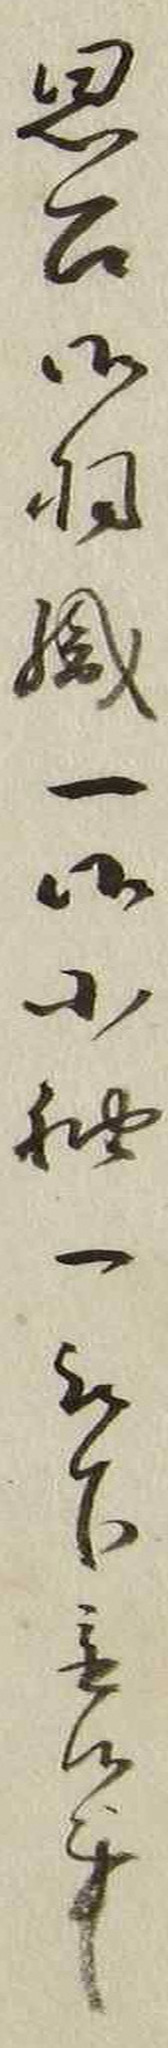思召御羽織一御小袖一被下置候事
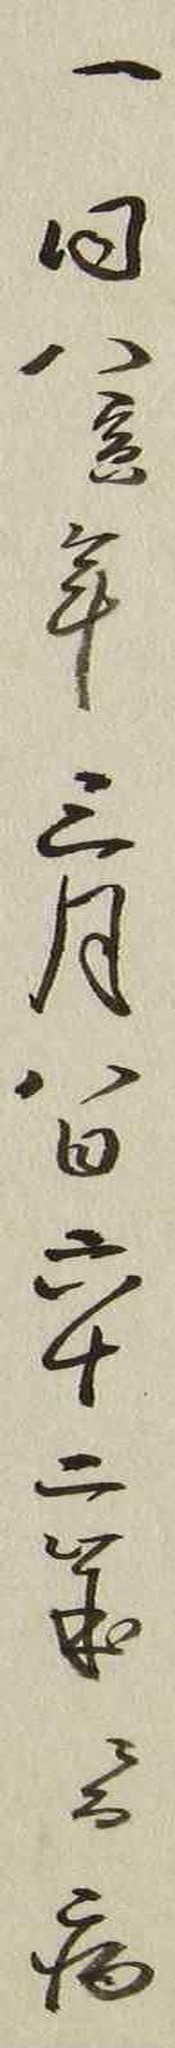一同八寅年三月八日六十二歳に而病
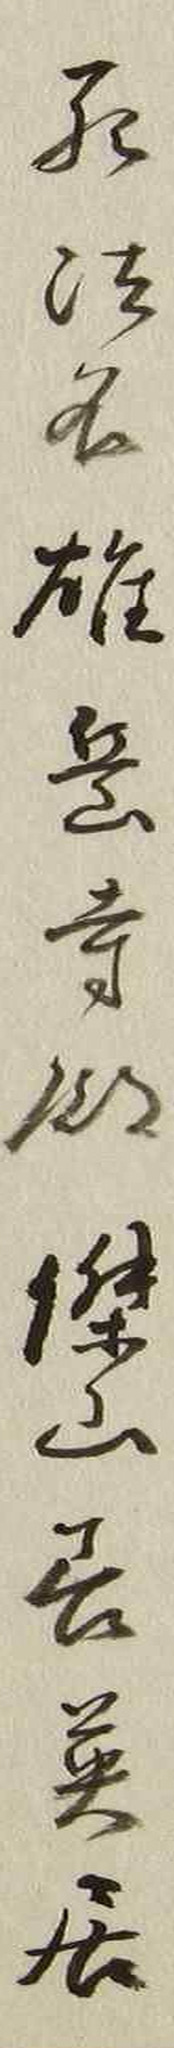死法名雄兵寺殿傑山善英居
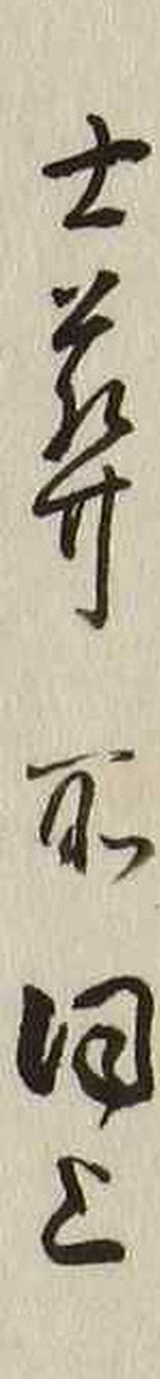士葬所同上
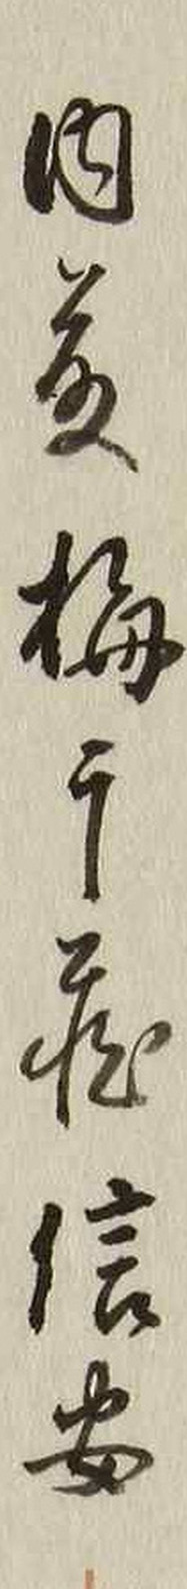内藤梅干蔵信安
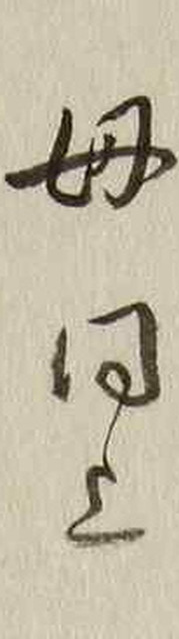母同上
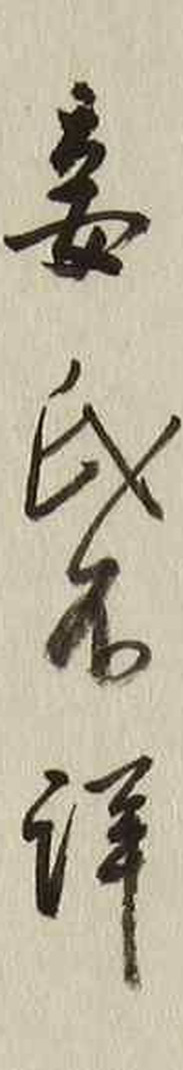妾氏不詳
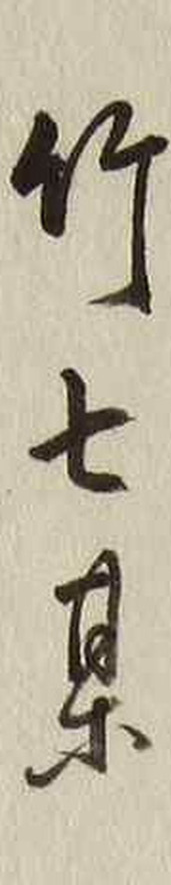竹七某
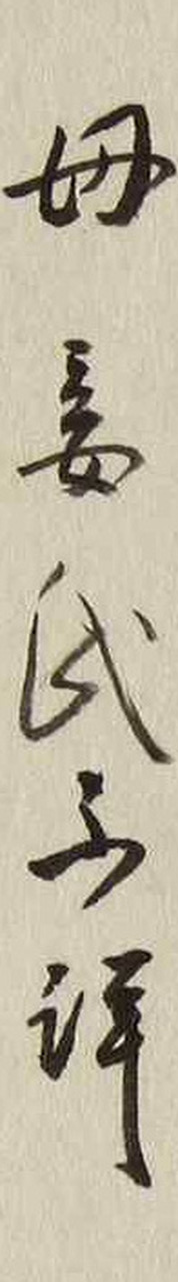母妾氏不詳
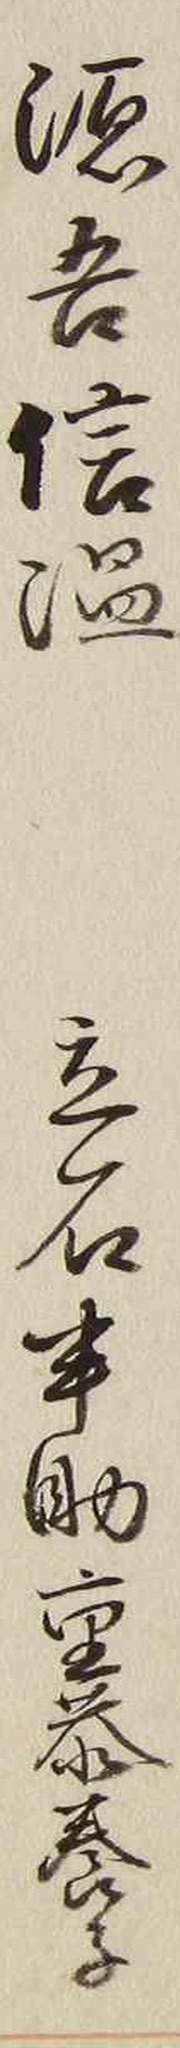源吾信温立石半助重泰養子
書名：諸士系譜　巻之159　な之部1
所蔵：会津若松市立会津図書館
